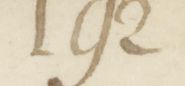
192
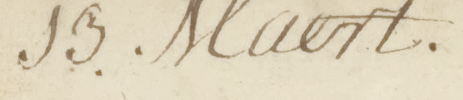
13. Maert.
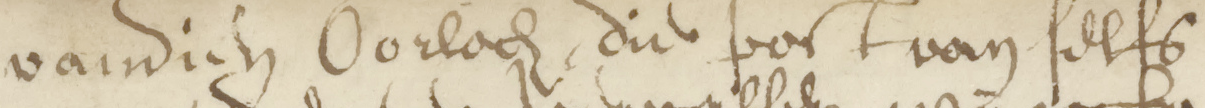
vandien Oorloch, die post van selfs
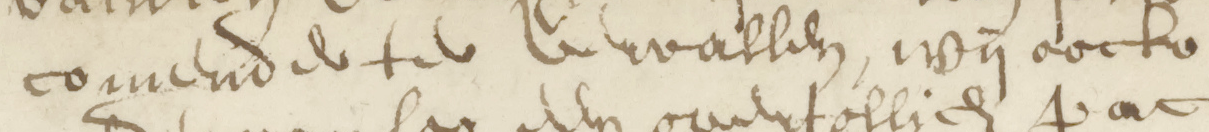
comende te vervallen, wij oock
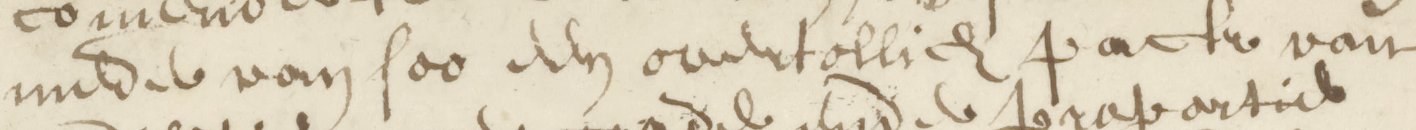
mede van soo een overtollich pack van
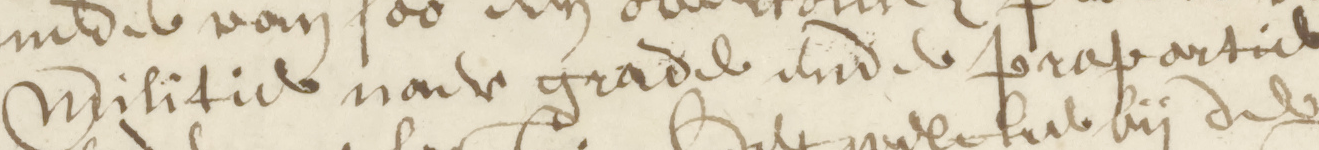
Militie naer grade ende proportie
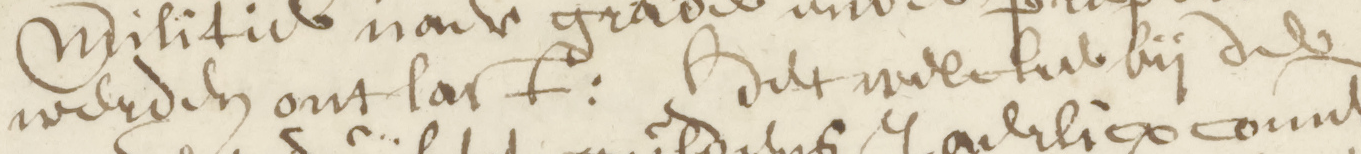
werden ontlast: Het welcke bij de
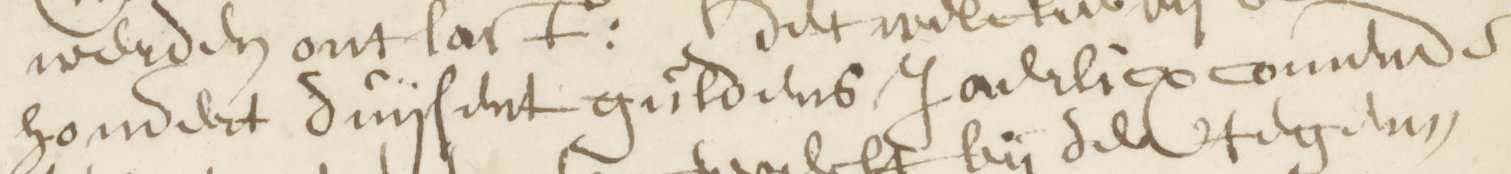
hondert duijsent guldens Jaerlicx comende
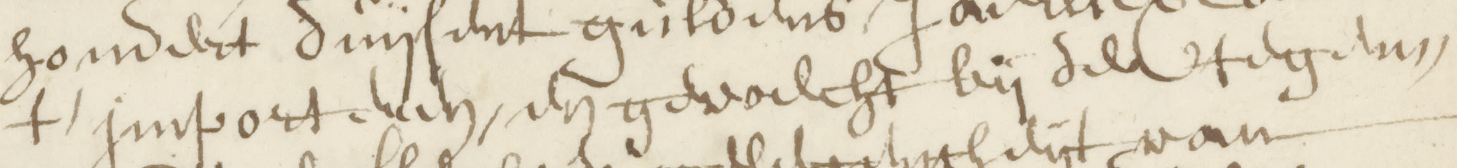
t'importeren, en gevoecht bij de tegen„
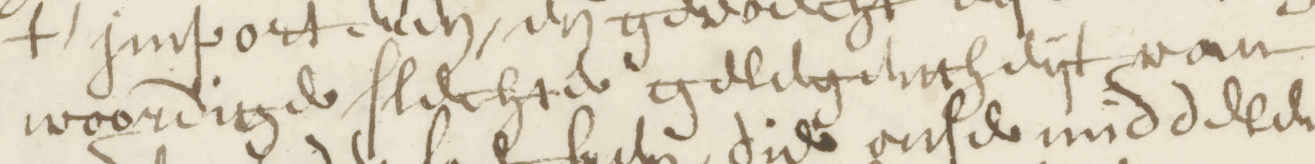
woordiche slechte gelegentheijt van
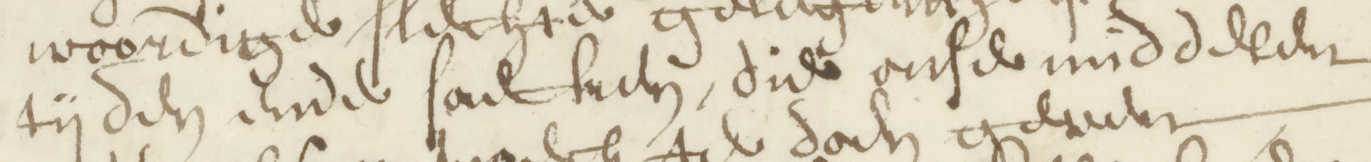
tijden ende saecken, die onse middelen
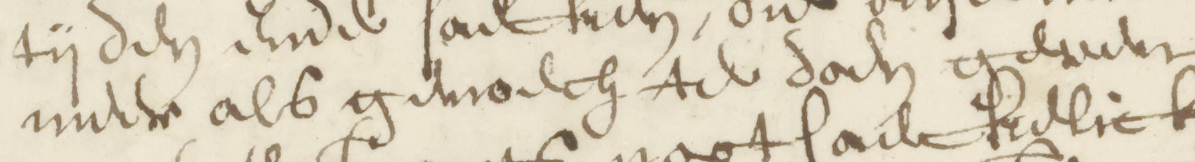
meer als genoech te doen geven
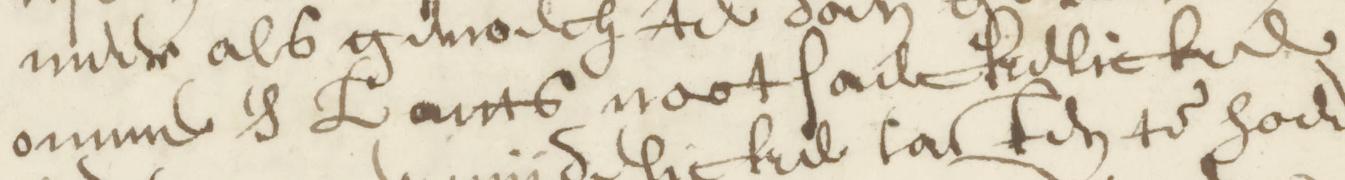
omme ‛s Lants nootsaeckelicke
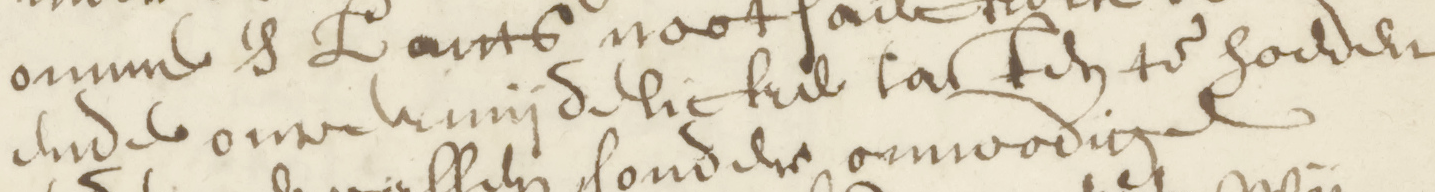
ende onvermijdelicke lasten te hoeden
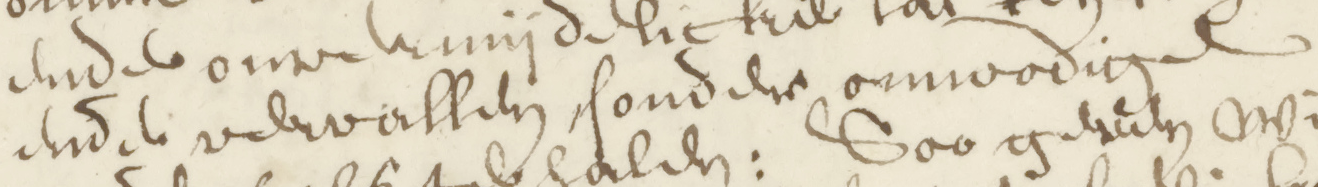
ende vervallen, sonder onnoodige
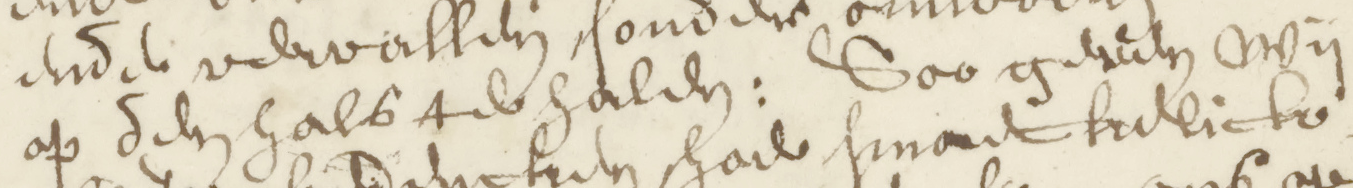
op den hals te halen: Soo geven Wij
